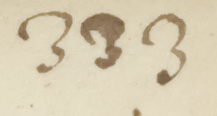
333
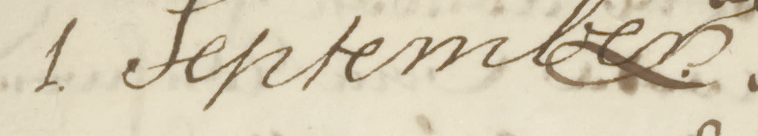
1. September
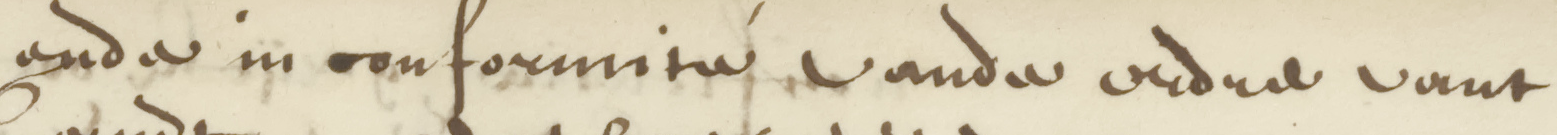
ende in conformité vande ordre vant
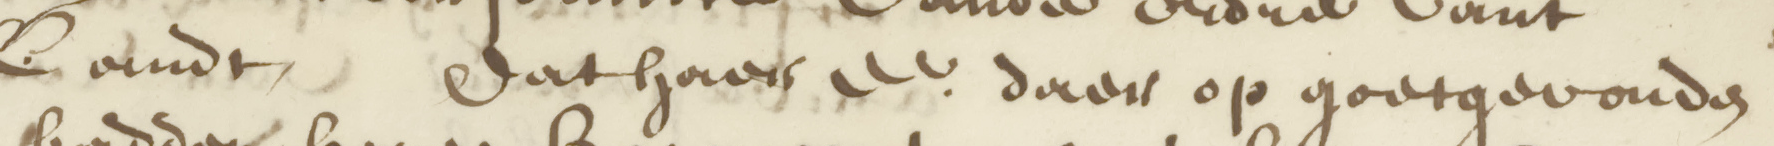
Landt. Dat haer E. daer op goetgevonden
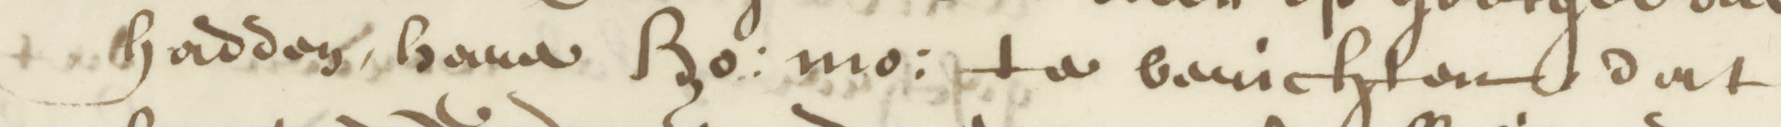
hadden, hare Ho: Mo: te berichten dat
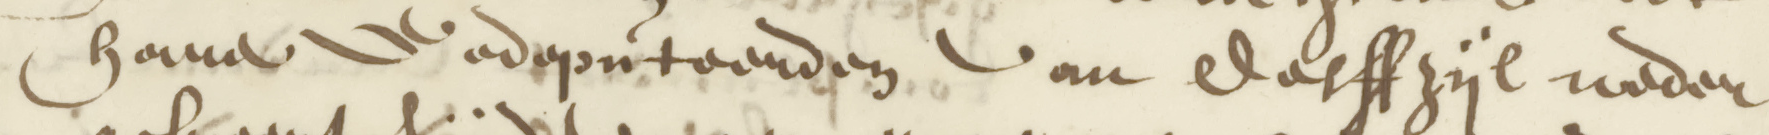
hare Gedeputeerden van Delffzijl weder
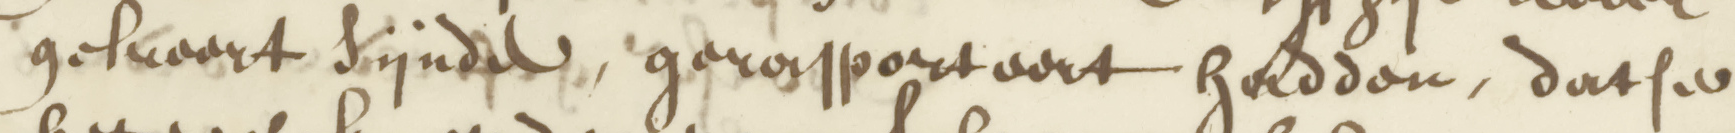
gekeert sijnde, gerapporteert hadden, datse
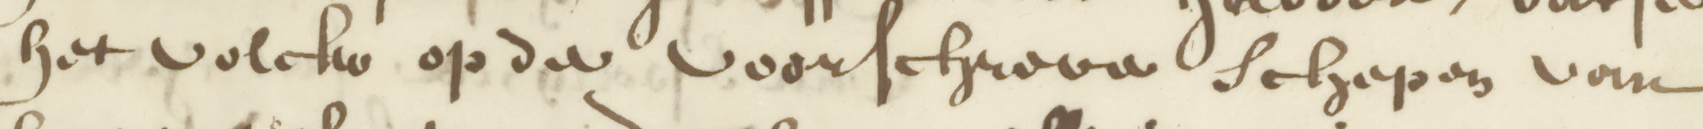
het volck op de voorschreve schepen van
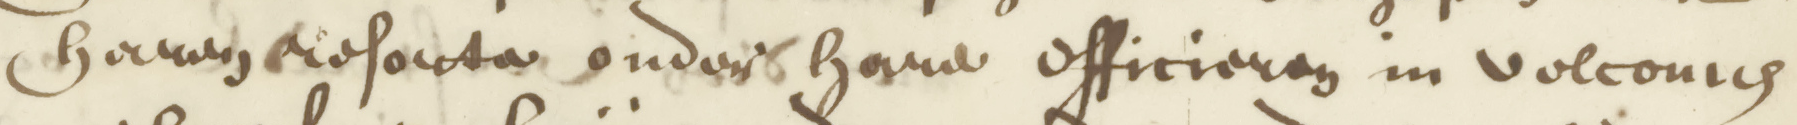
haren resorte onder hare officieren in volcomen
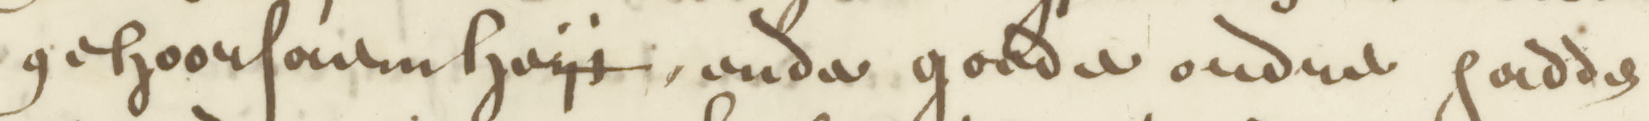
gehoorsaemheijt, ende goede ordre hadden
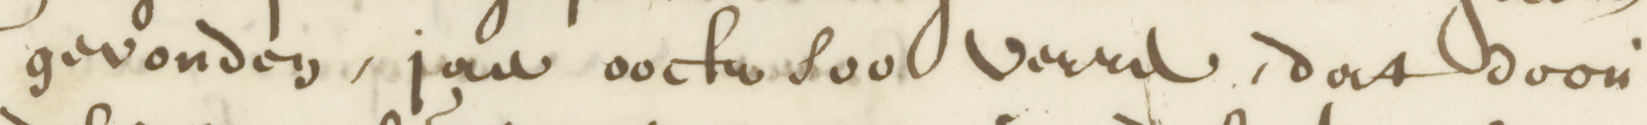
gevonden, jae oock soo verre, dat door
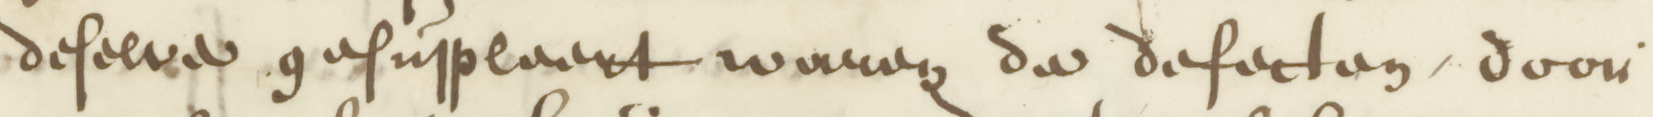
deselve gesuppleert waren de defecten, door
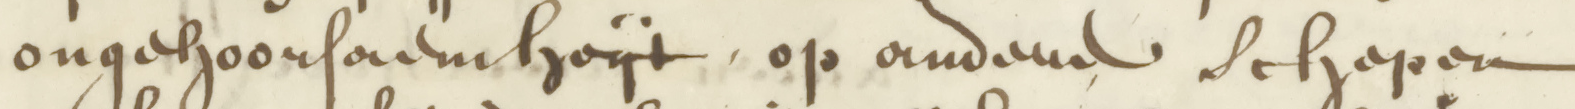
ongehoorsaemheijt, op andere schepen
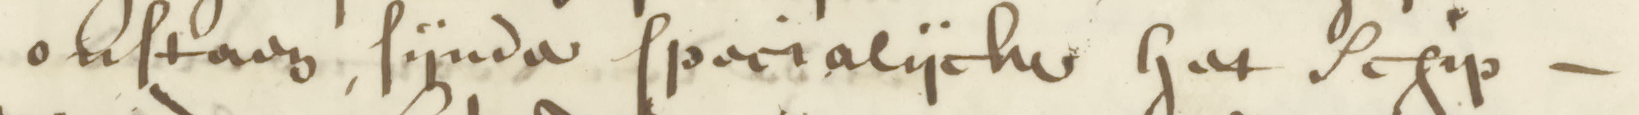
onstaen, sijnde specialijck het schip -
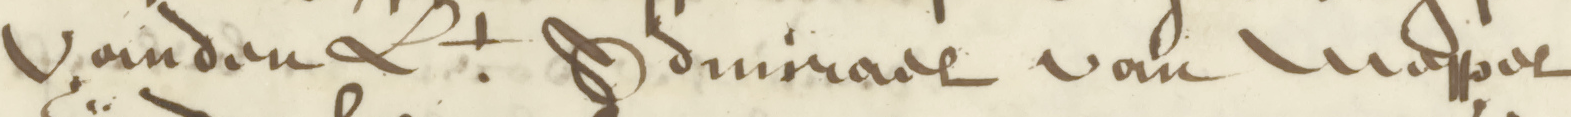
vanden Lt. Admirael van Meppel
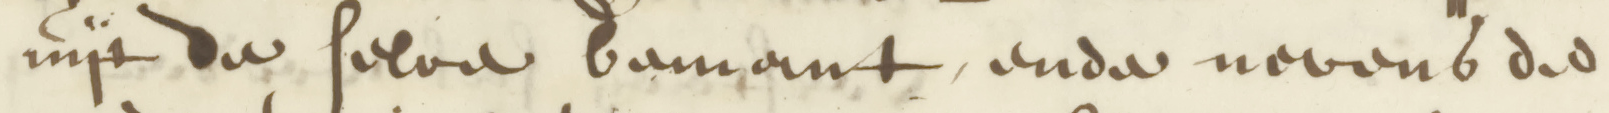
uijt de selve bemant, ende nevens de
